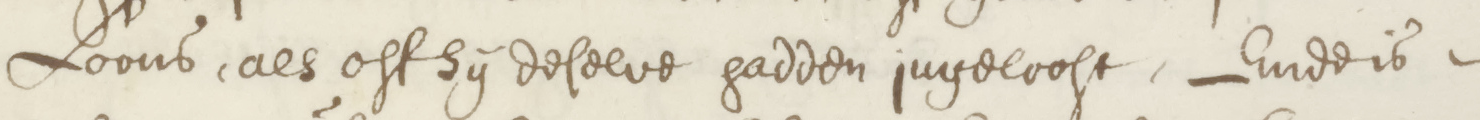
Loons, als oft sij deselve hadden ingeloost. Ende is
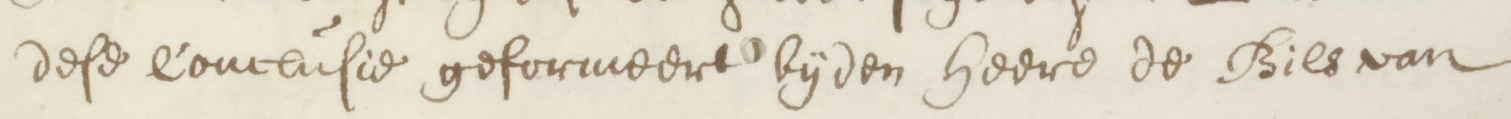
dese conclusie geformeert bij den heere de Bils van
